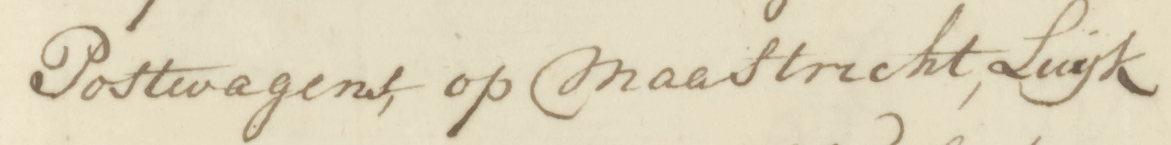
Postwagens op Maastricht, Luijk
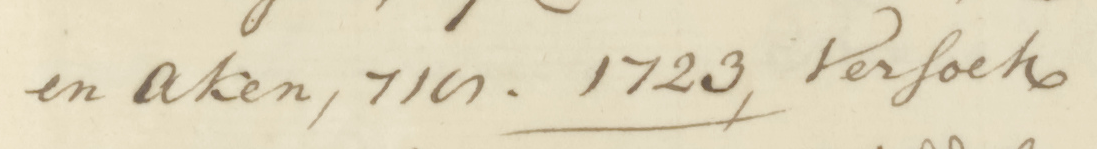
en Aken, 718. 1723, Versoek
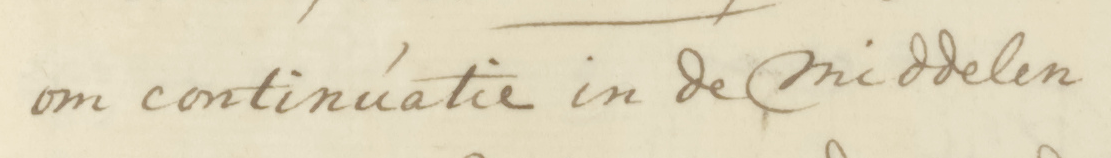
om continuatie in de middelen
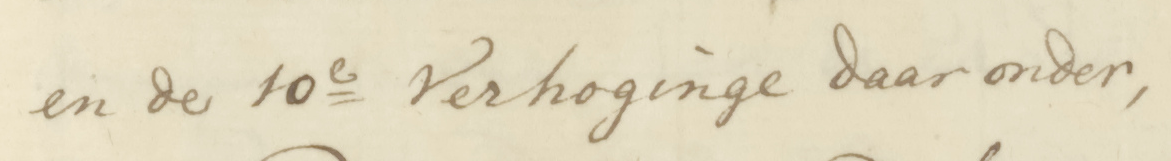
en de 10e Verhoginge daar onder,
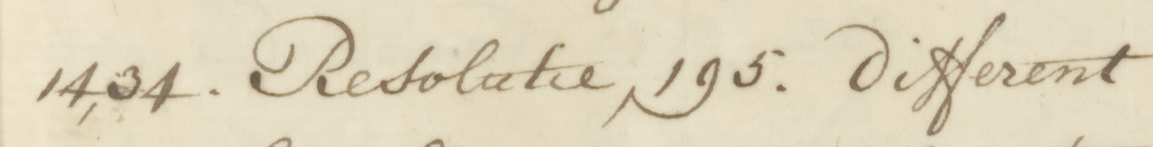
1434. Resolutie, 195. Different
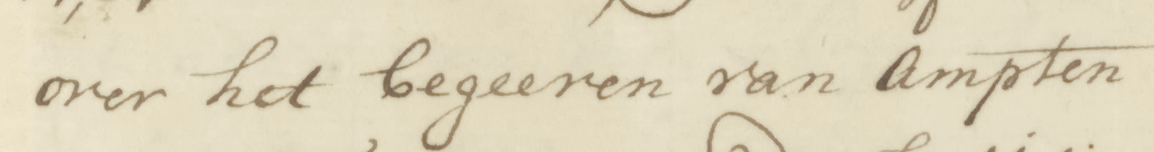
over het begeeven van Ampten
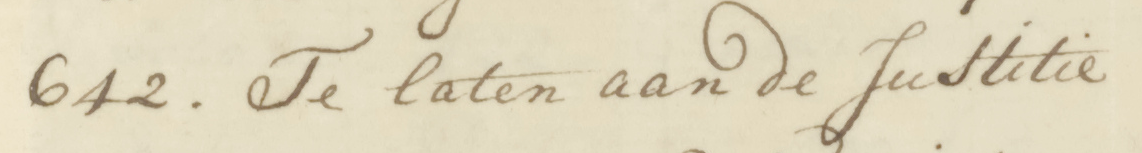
642. Te laten aan de Justitie
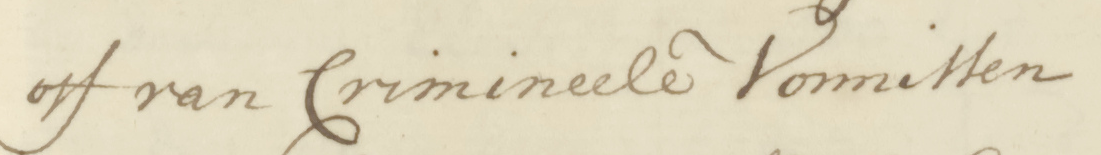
off van Crimineele Vonnissen
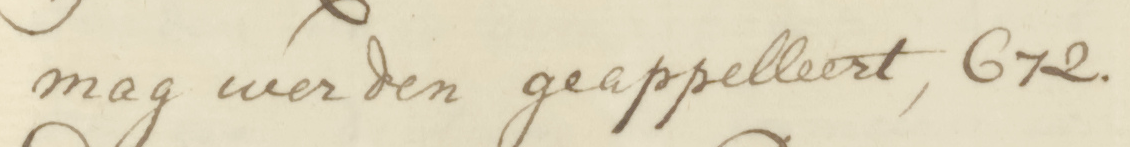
mag werden geappelleert 672.
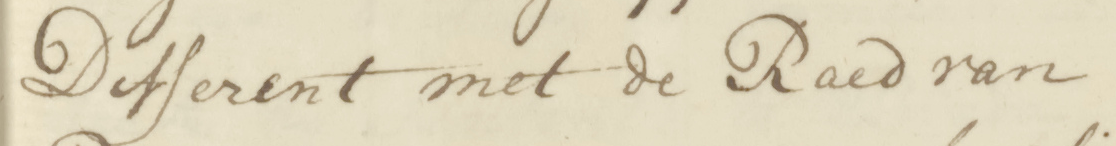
Different met de Raed van
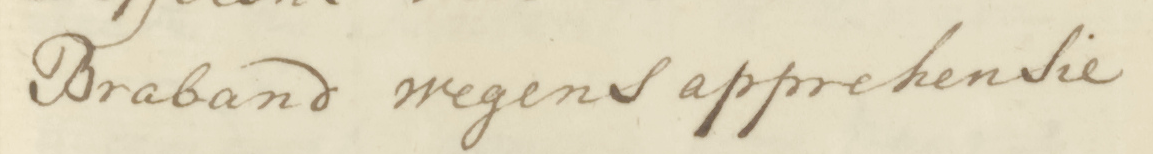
Braband, wegens apprehensie
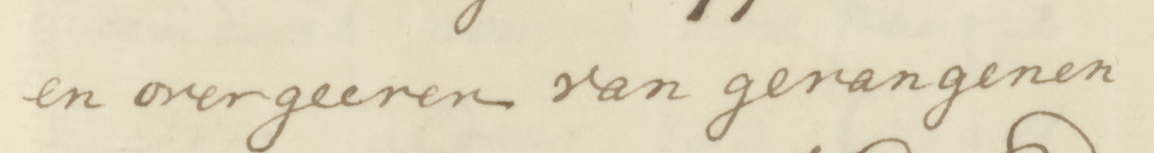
en overgeeven van gevangenen
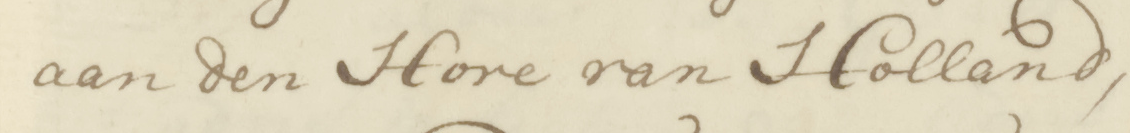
aan den Hove van Holland,
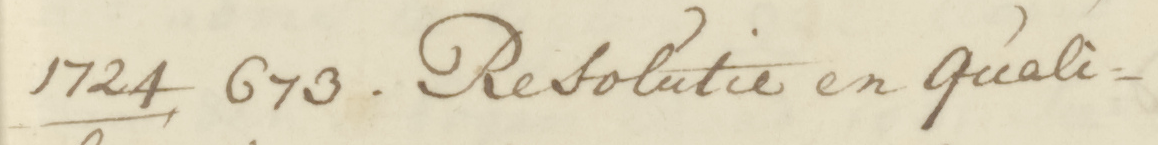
1724, 673. Resolutie en Quali=
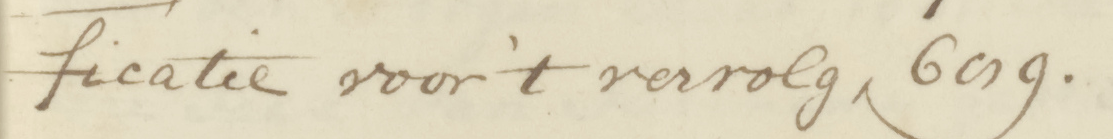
ficatie voor 't vervolg, 689.
